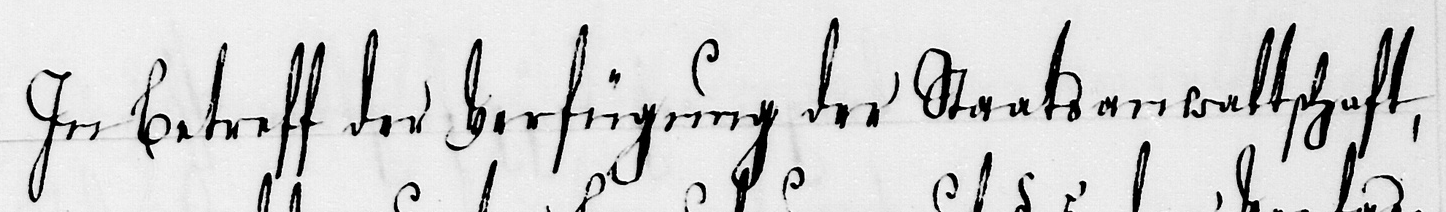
In Betreff der Verfügung der Staatsanwaltschaft,
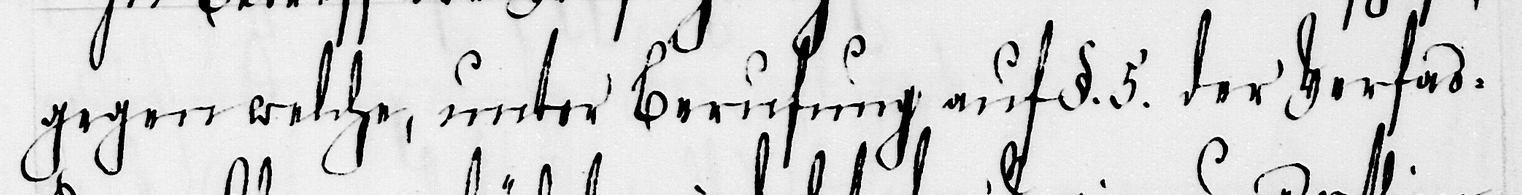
gegen welche, unter Berufung auf §. 5. der Verfaß¬
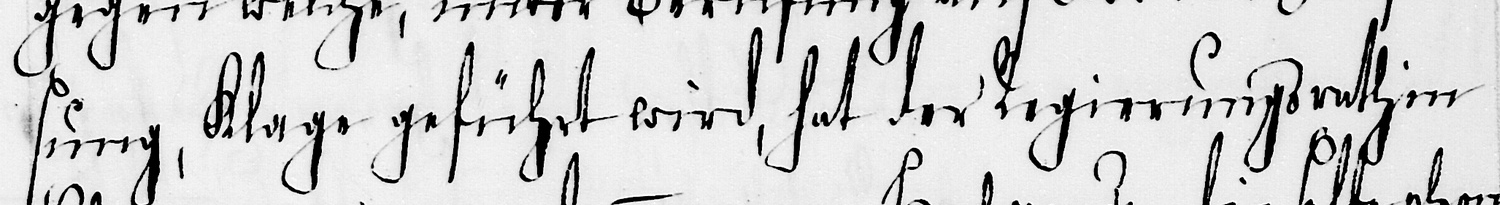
ung, Klage geführt wird, hat der Regierungsrath in
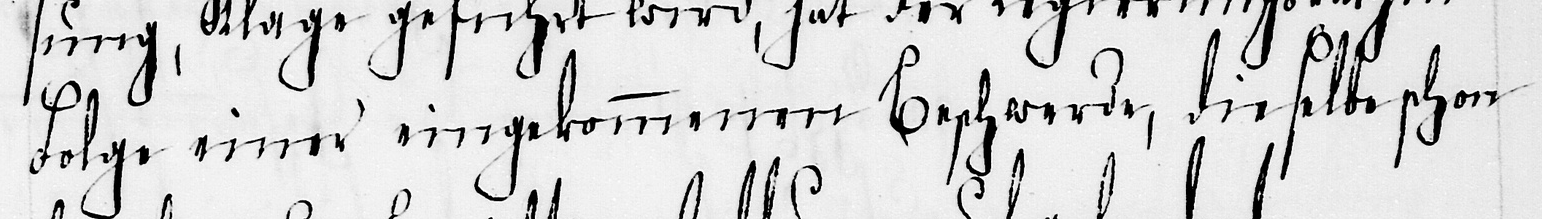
Folge einer eingekommenen Beschwerde, dieselbe schon
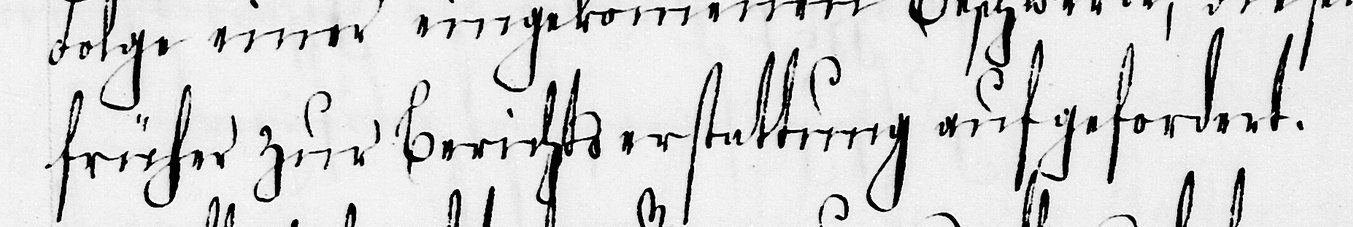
früher zur Berichtserstattung aufgefordert.
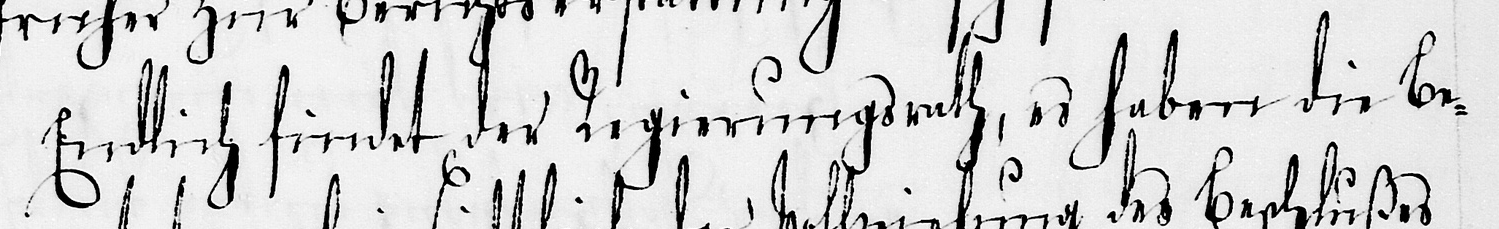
Endlich findet der Regierungsrath, es haben die Be¬
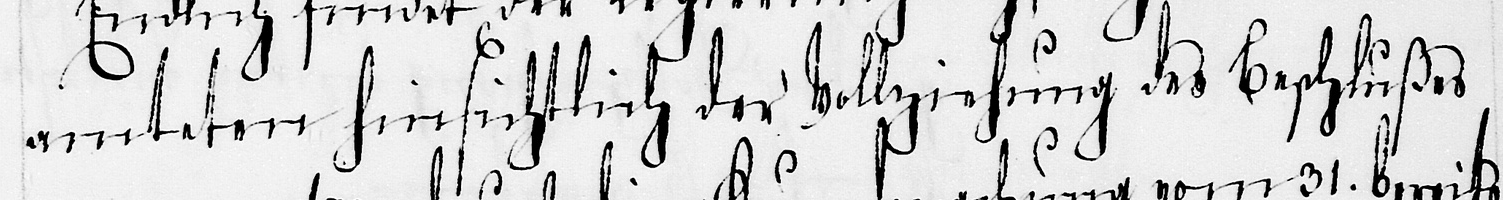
amteten hinsichtlich der Vollziehung des Beschlußes
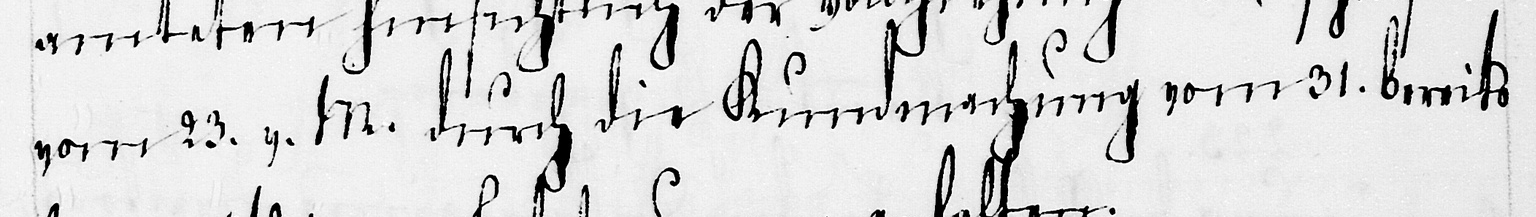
vom 23. v. M. durch die Kundmachung vom 31. bereits
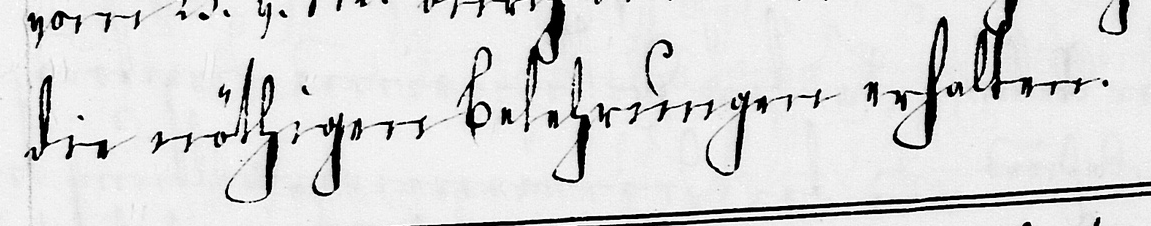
die nöthigen Belehrungen erhalten.
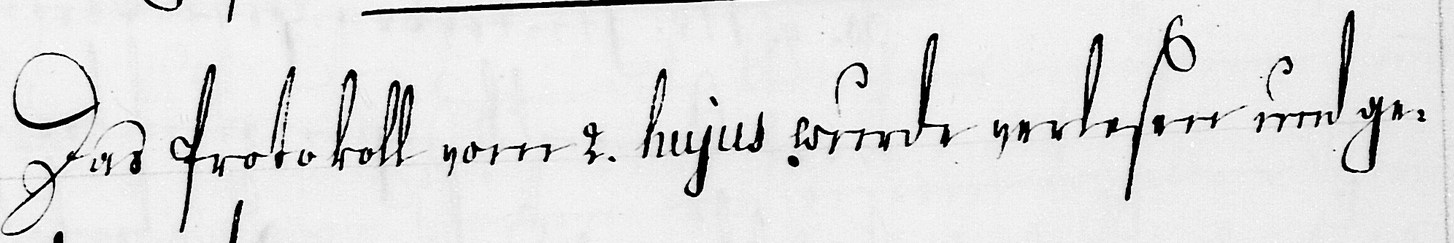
Das Protokoll vom 2. hujus wurde verlesen und ge¬
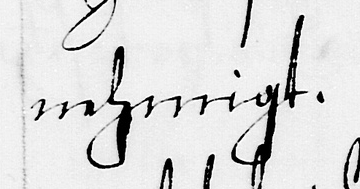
nehmigt.
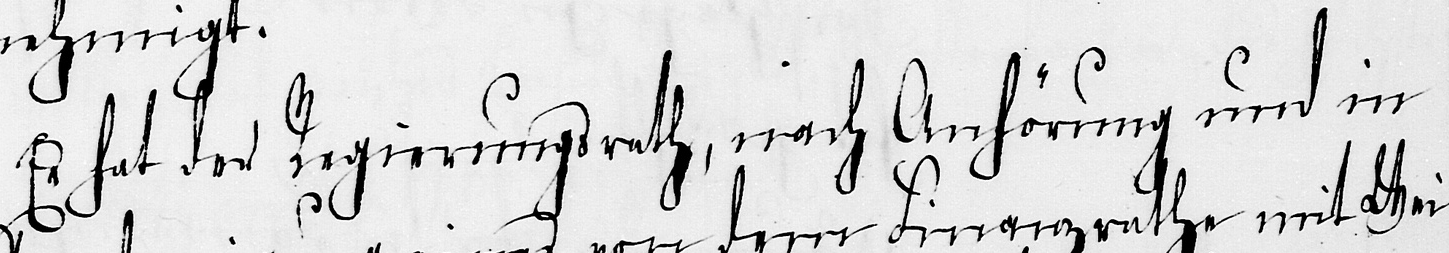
Es hat der Regierungsrath, nach Anhörung und in
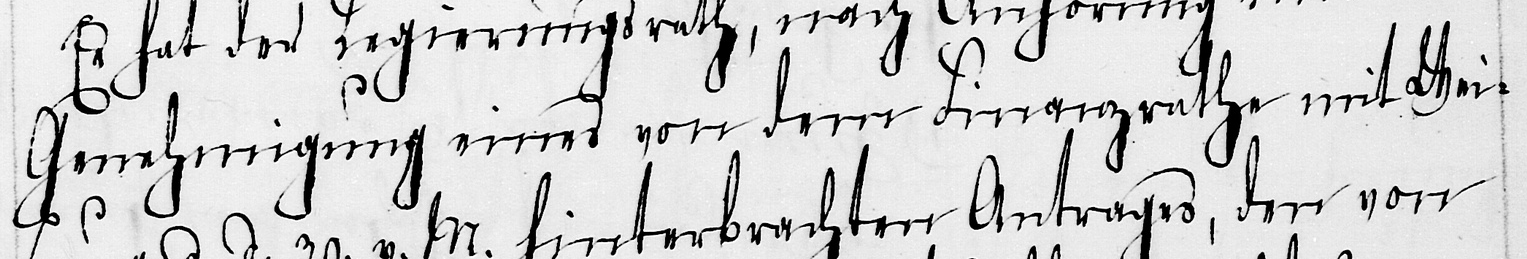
Genehmigung eines von dem Finanzrathe mit Wei¬
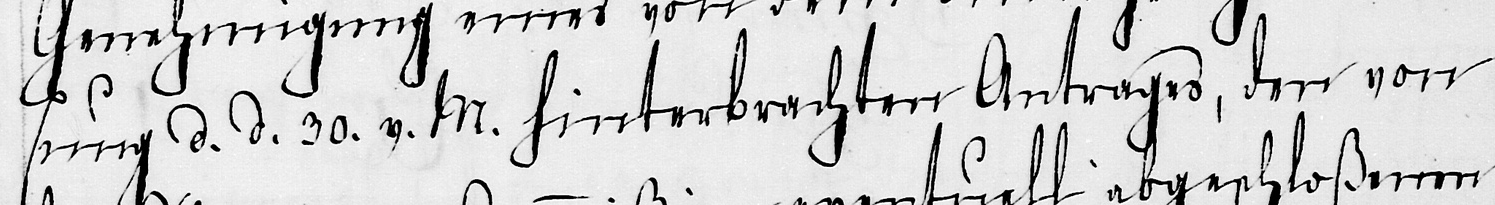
sung d. d. 30. v. M. hinterbrachten Antrages, den von
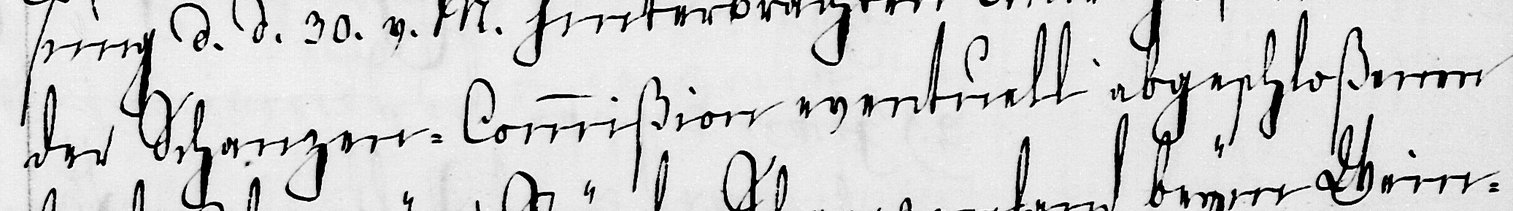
der Schanzen-Commißion eventuell abgeschloßenen
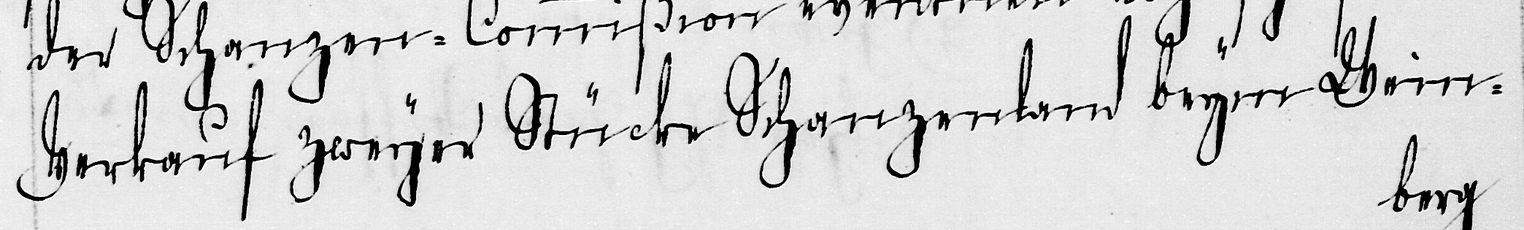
Verkauf zweyer Stücke Schanzenland beym Wein-
